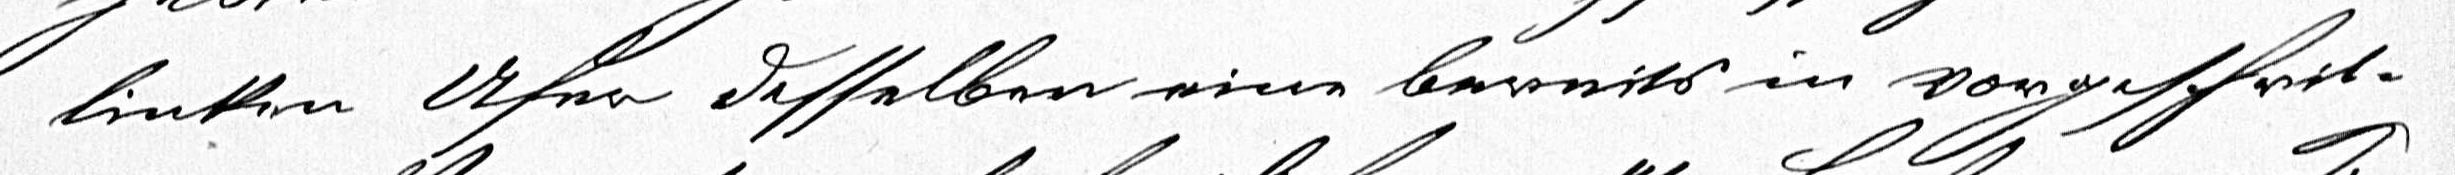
linken Ufer desselben eine bereits in vorgeschrit¬
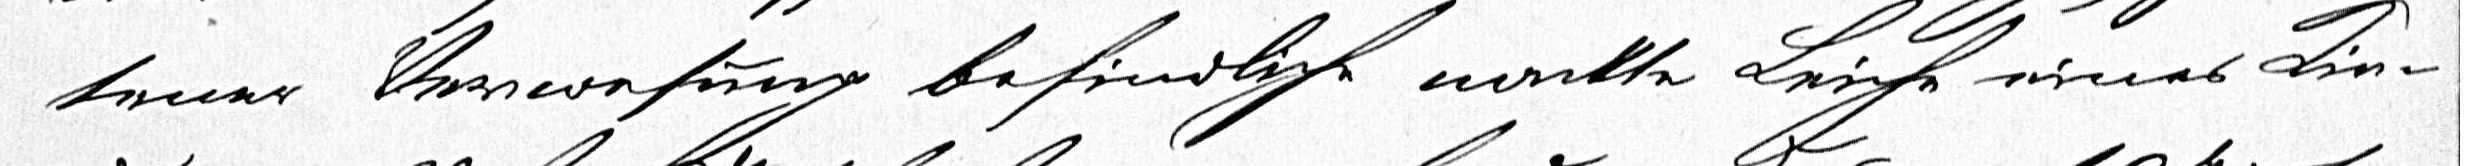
tener Verwesung befindliche nackte Leiche eines Kin¬
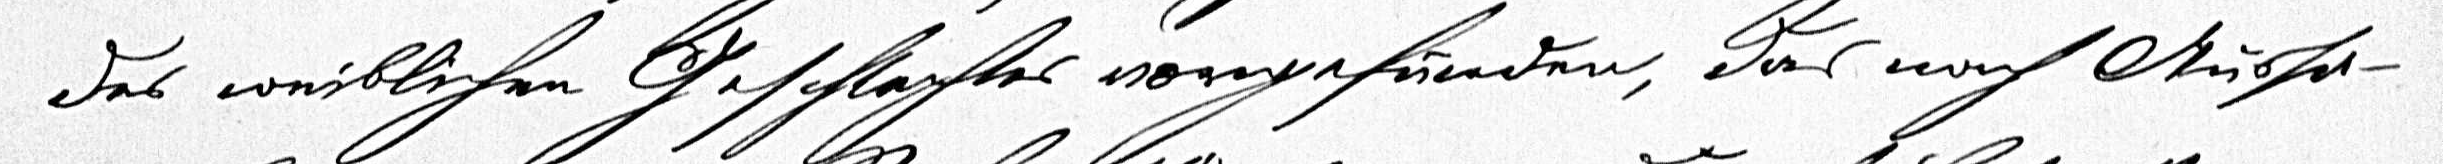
des weiblichen Geschlechtes vorgefunden, das noch Aussa¬
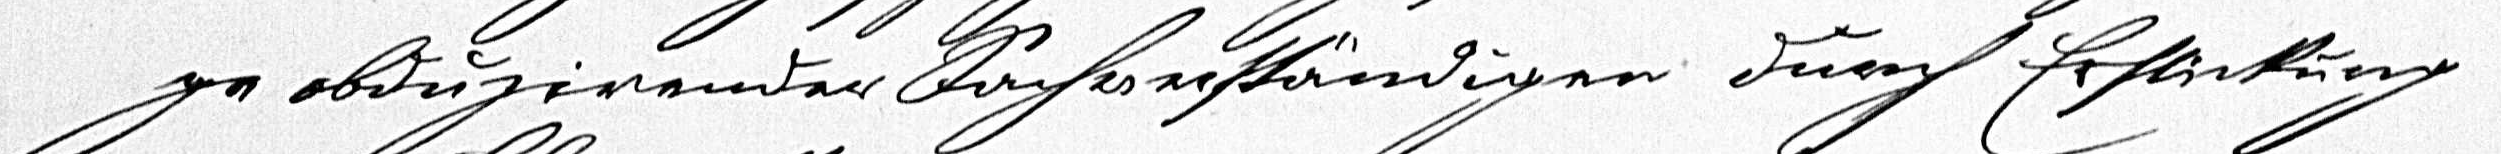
ge obduzirender Sachverständigen durch Erstickung
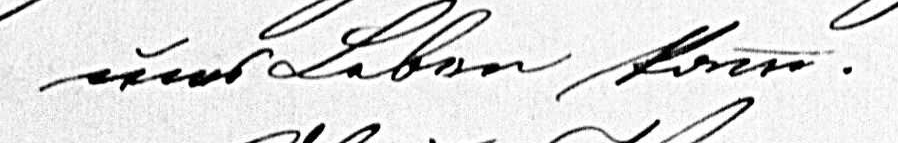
ums Leben kam.
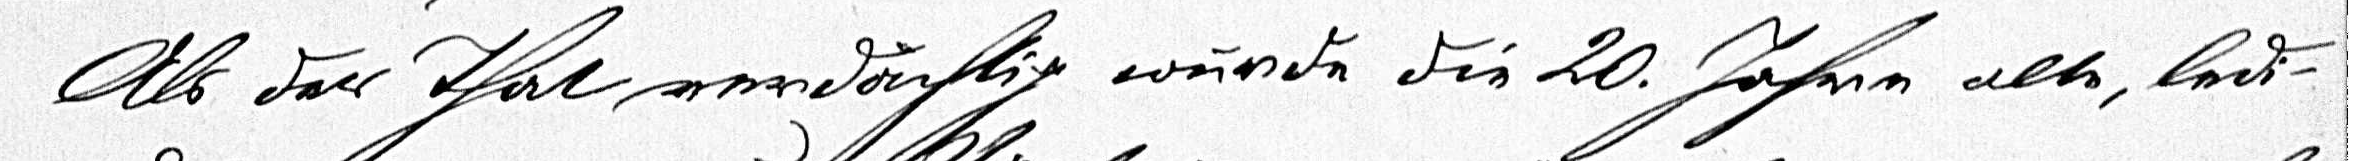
Als der That verdächtig wurde die 20. Jahre alte, ledi¬
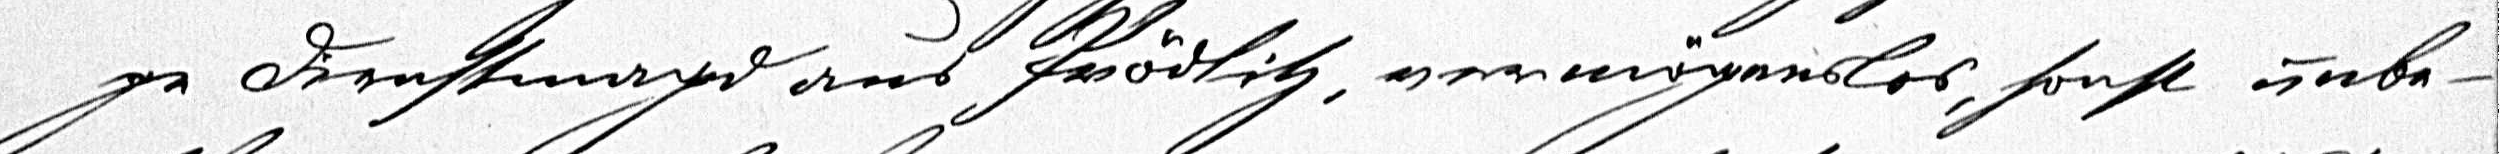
ge Dienstmagd aus Prödlitz, vermögenslos, sonst unbe¬
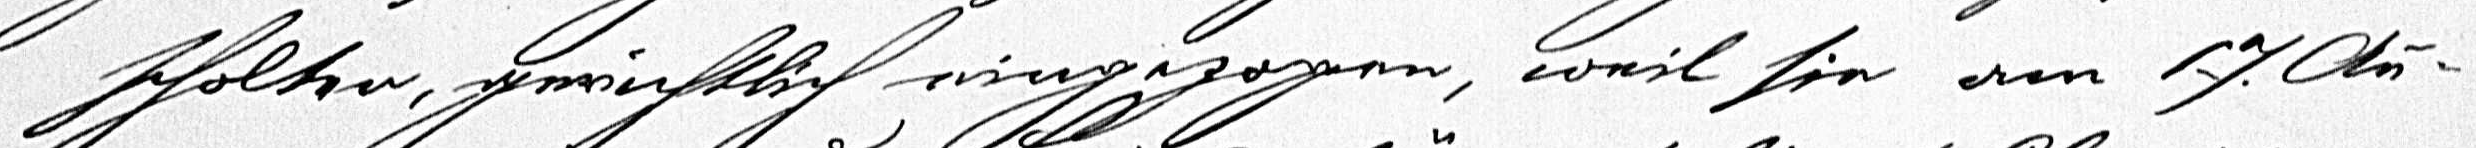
scholten, gerichtlich eingezogen, weil sie am 17 Au¬
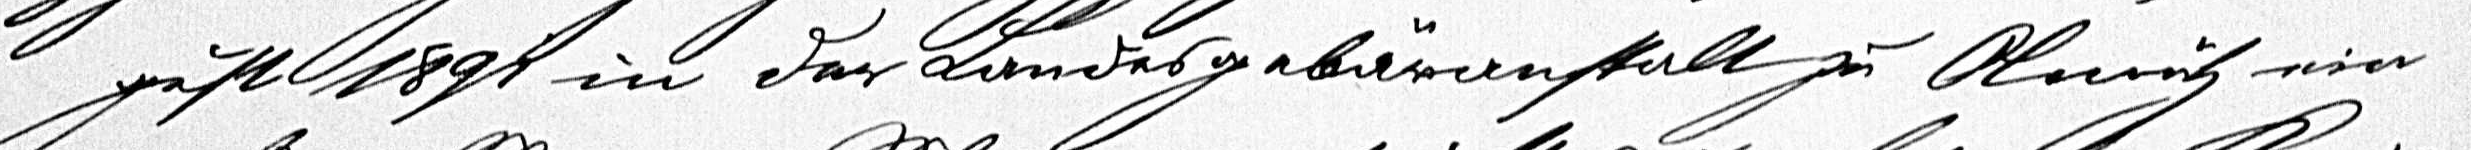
gust 1891 in der Landesgebäranstalt zu Olmütz ein
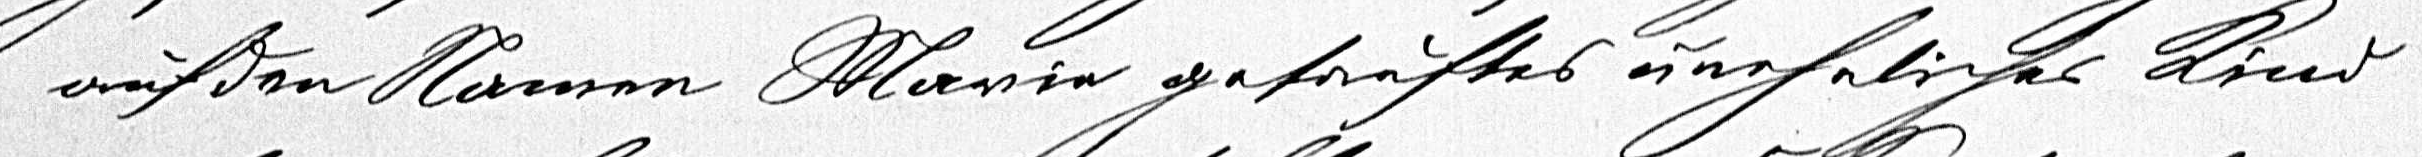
auf den Namen Marie getauftes uneheliches Kind
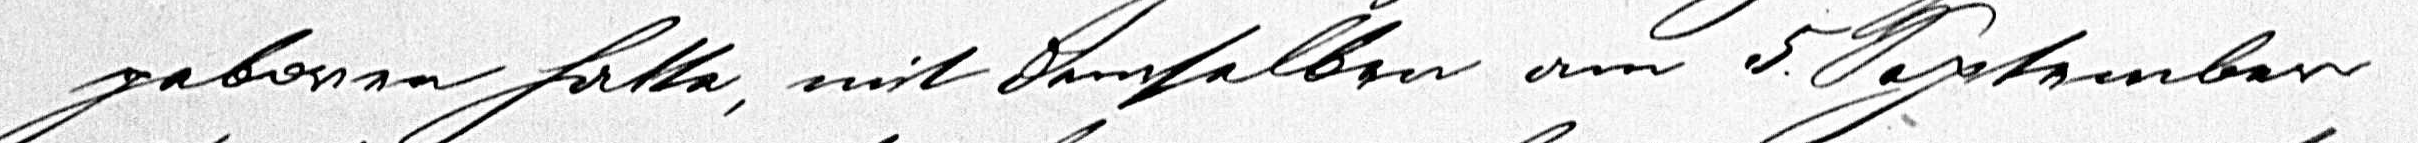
geboren hatte, it demselben am 5. September
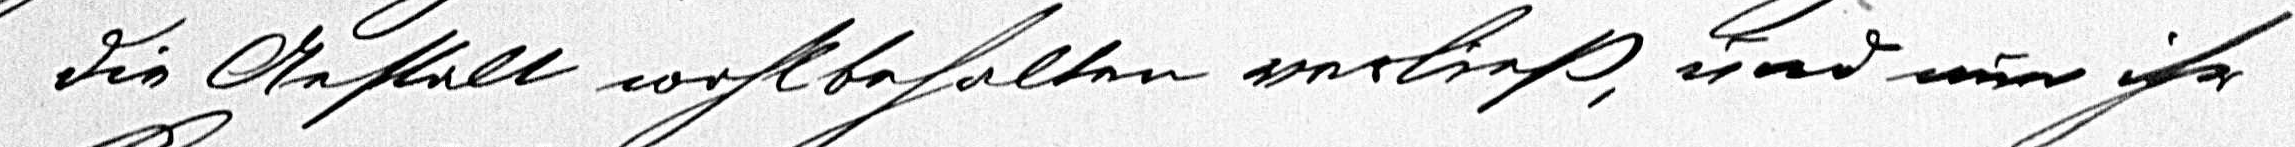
die Anstalt wohlbehalten verließ, und nun ihr
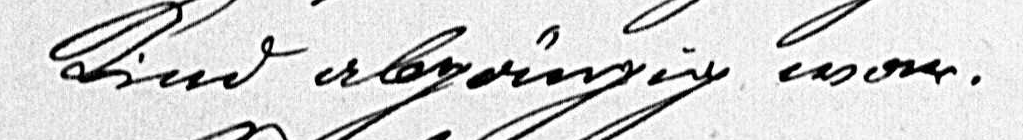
Kind abgängig war.
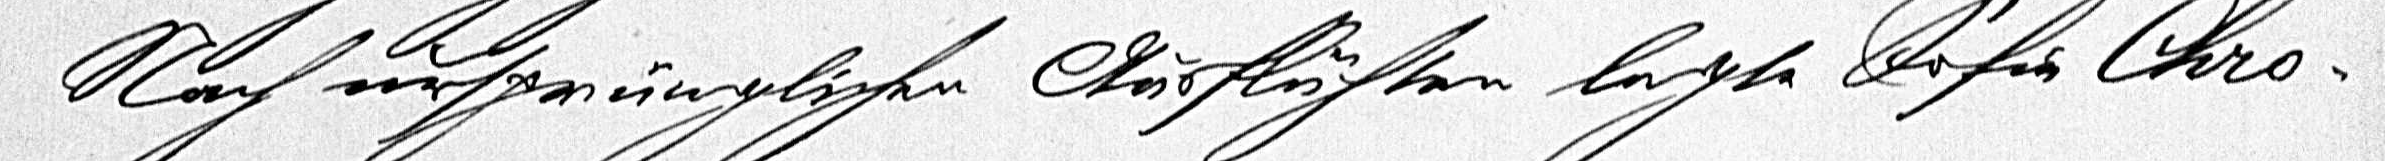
Nach ursprünglichen Ausflüchten lege Sofia Chro¬
